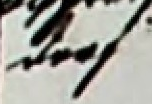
dorf
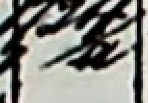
734/a
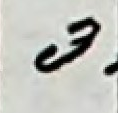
3
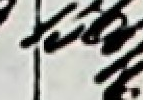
1561/6
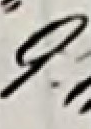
9
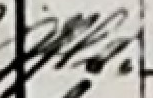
Pfls„
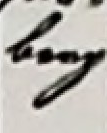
berg
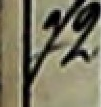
72
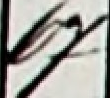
67
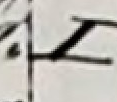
I
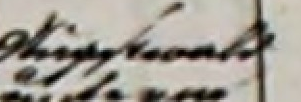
Augstwald
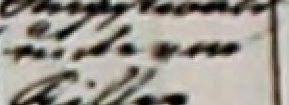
unteren
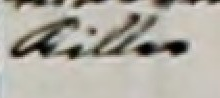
Killer
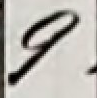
9
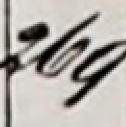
269
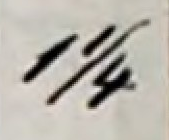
1 1/4
